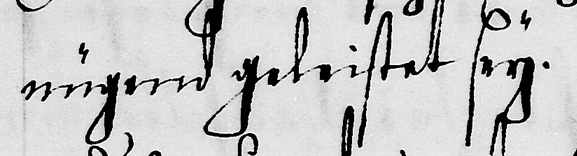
enügend geleistet sey.
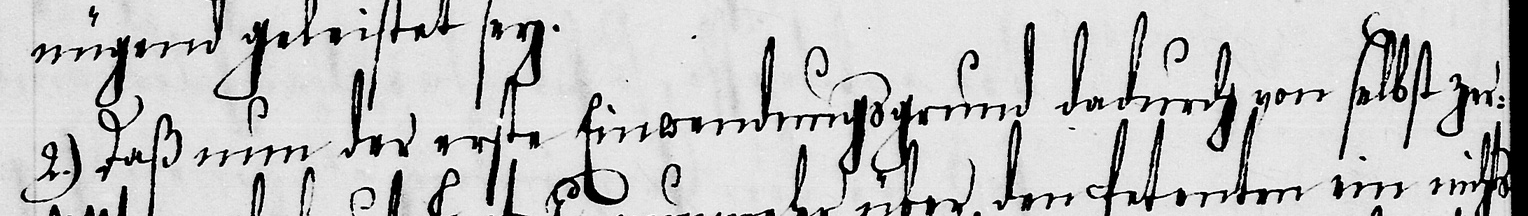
2.) Daß nun der erste Einwendungsgrund dadurch von selbst z¬
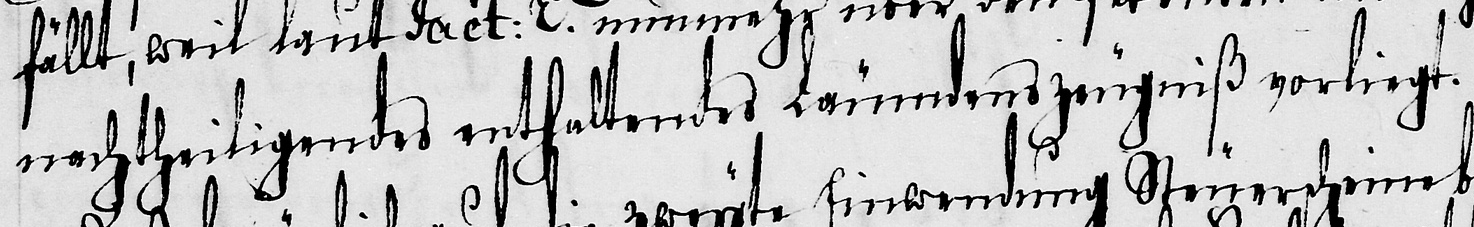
nachtheiligendes enthaltendes Läumdenszeugniß vorliegt.
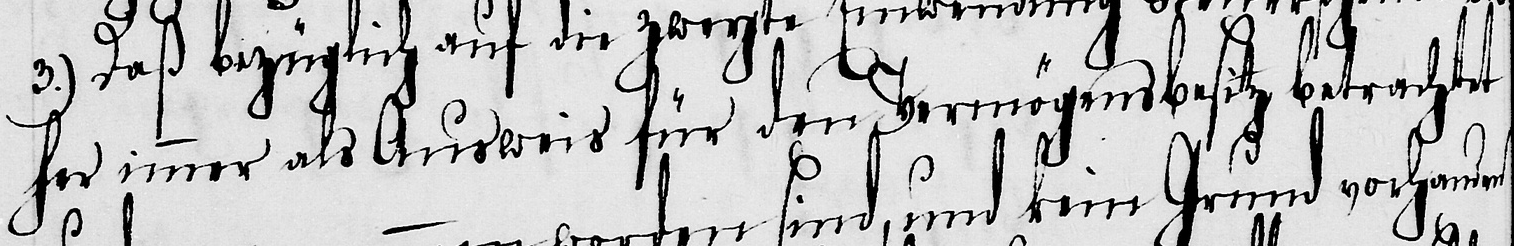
her immer als Ausweis für den Vermögensbesitz betrachtet
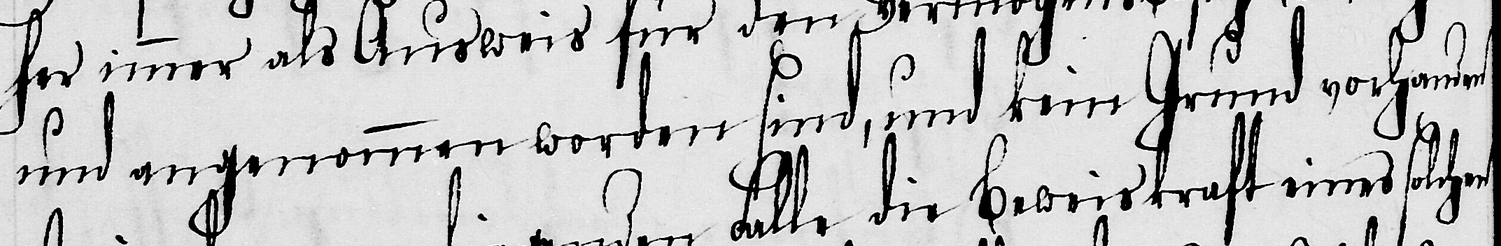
und angenommen worden sind, und kein Grund vorhanden
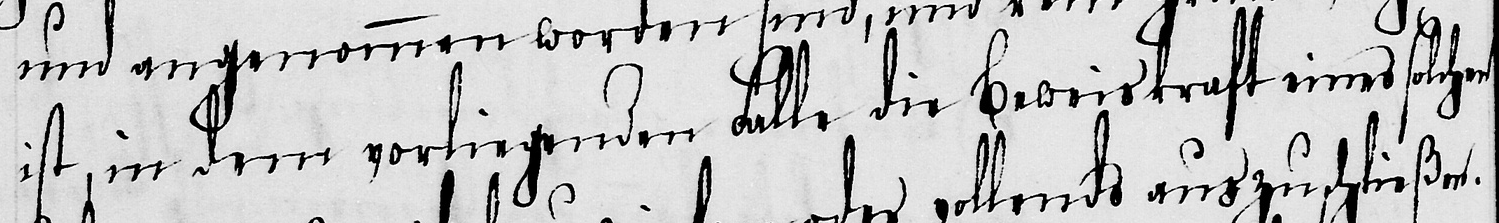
ist, in dem vorliegenden Falle die Beweiskraft eines solch¬
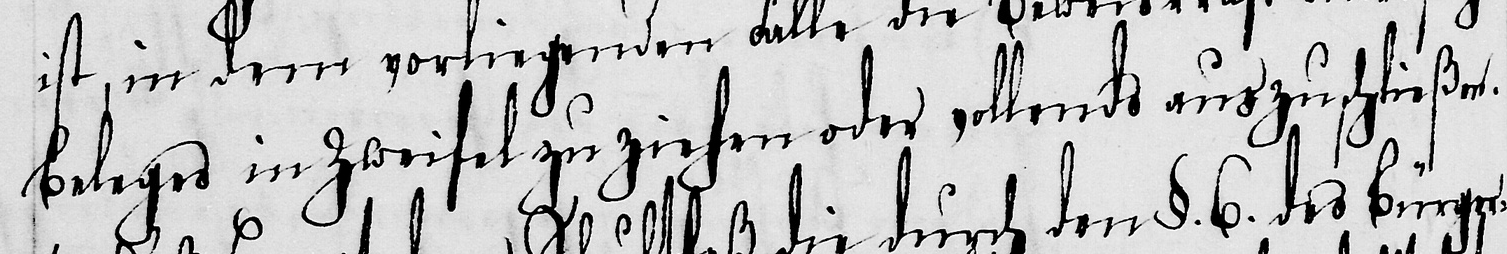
Beleges in Zweifel zu ziehen oder vollends auszuschließe¬
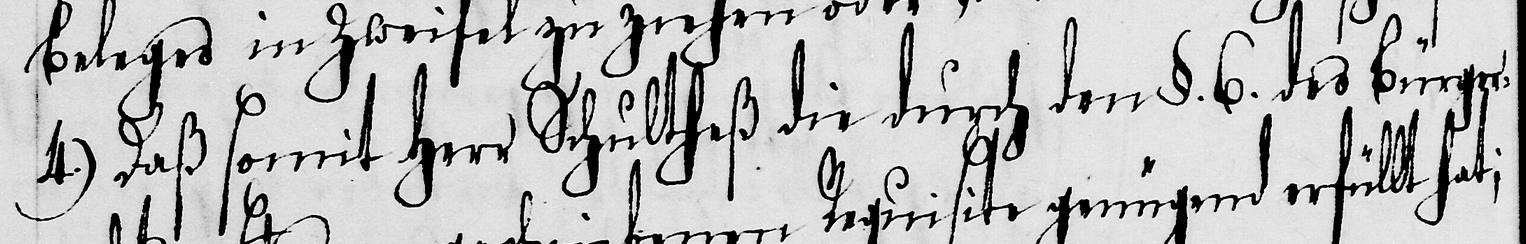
4.) Daß somit Herr Schultheß die durch den §. 6. des Bürge¬
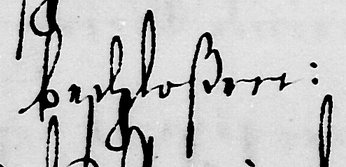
beschloßen:
